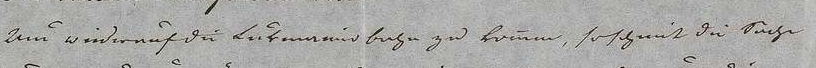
Um wieder auf die Lukmanier Bahn zu kommen, so scheint die Sache
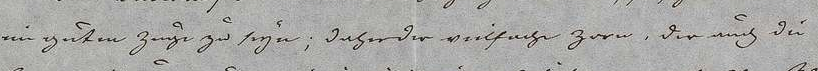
im guten Zuge zu seyn; daher der vielfache Zorn, der auch die
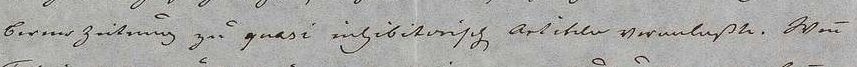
Berner Zeitung zu quasi inhibitorischen Artikeln veranlaßte. Wenn
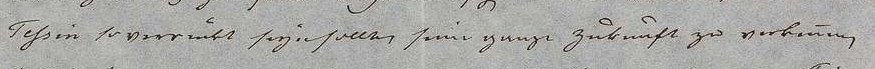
Tessin so verrückt seyn sollte, seine ganze Zukunft zu verkennen,
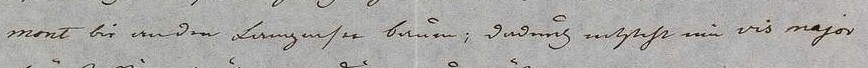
mont bis an den Langensee bauen; dadurch entsteht eine vis major
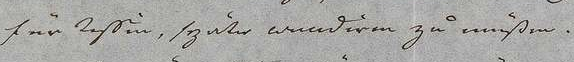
für Tessin, später concediren zu müßen.
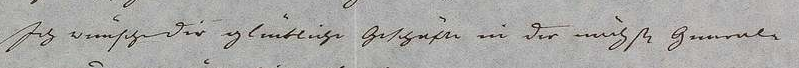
Ich wünsche Dir glückliche Geschäfte in der nächsten General-
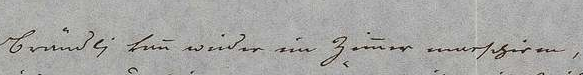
Brändli kann wieder im Zimmer marschiren,
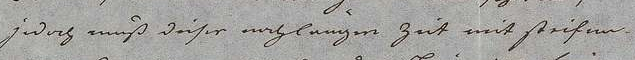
jedoch muß dieses noch längere Zeit mit steifem
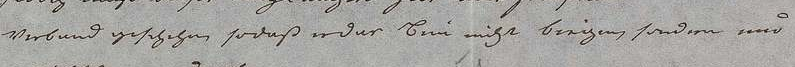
Verband geschehen, so daß er das Bein nicht biegen, sondern nur
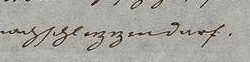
nachschleppen darf.
